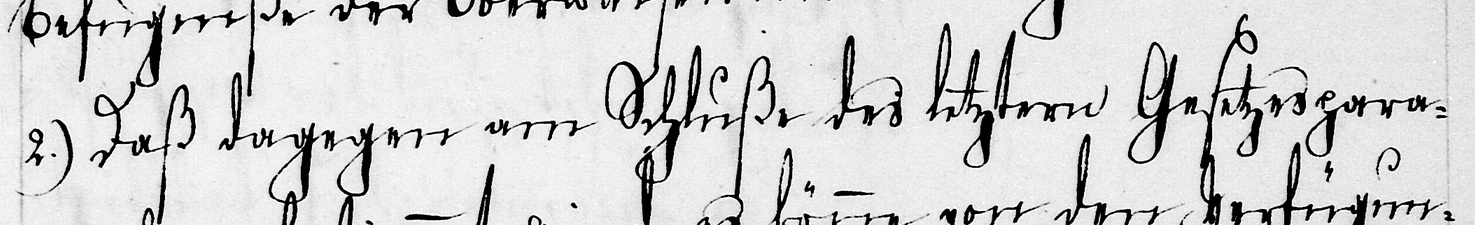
2.) Daß dagegen am Schluße des letzten Gesetzespara¬
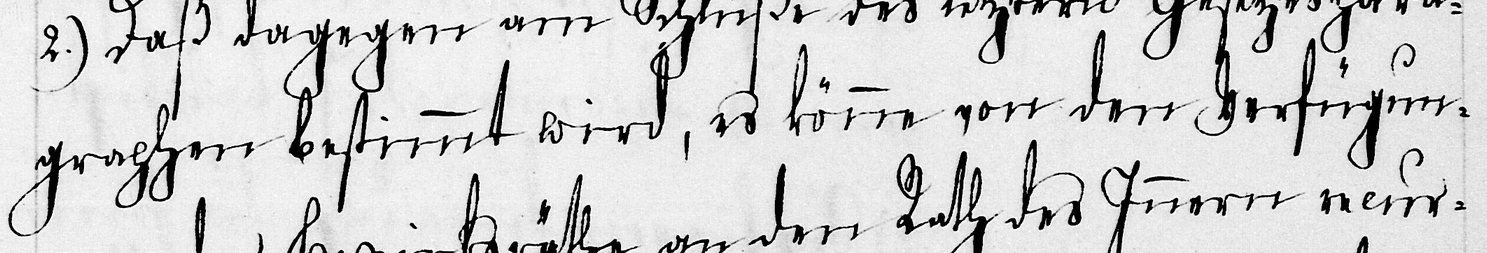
graphen bestimmt wird, es könne von den Verfügun¬
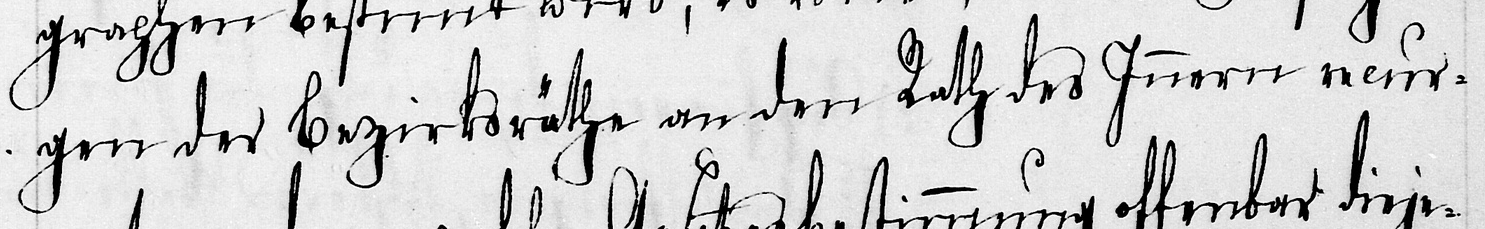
gen der Bezirksräthe an den Rath des Innern recur¬
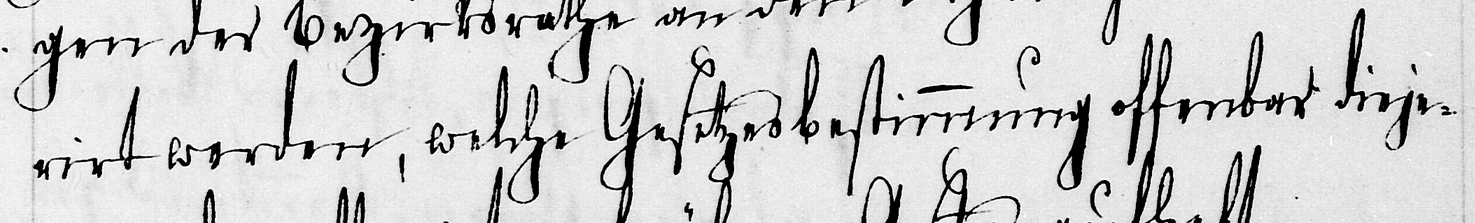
rirt werden, welche Gesetzesbestimmung offenbar derje¬
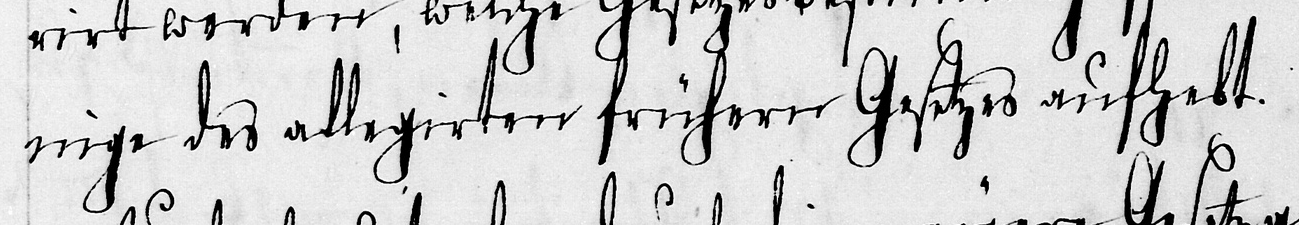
nige des allegirten frühern Gesetzes aufhebt.
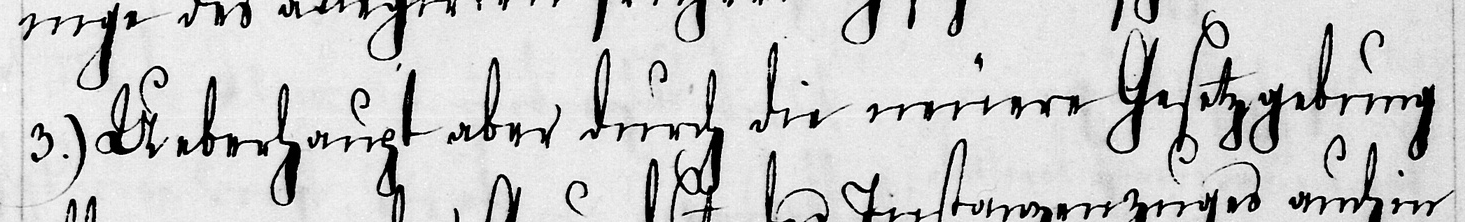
3.) Ueberhaupt aber durch die neuere Gesetzgebung
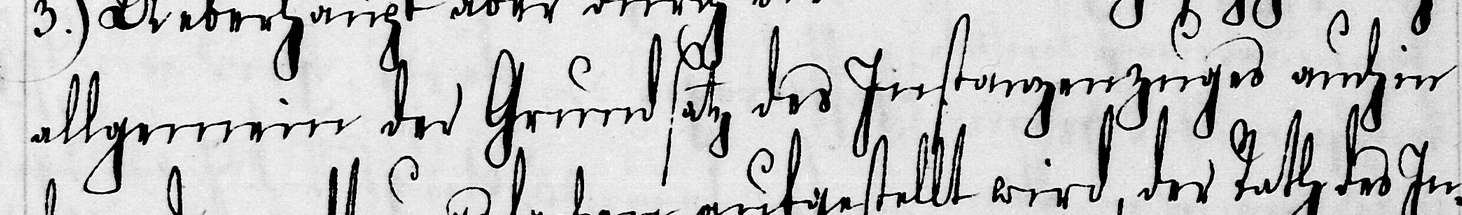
allgemein der Grundsatz des Instanzenzuges auch in
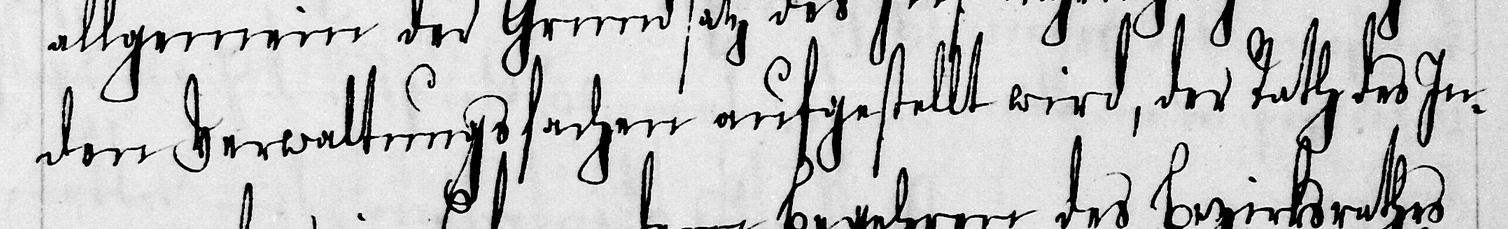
den Verwaltungssachen aufgestellt wird, der Rath des I¬
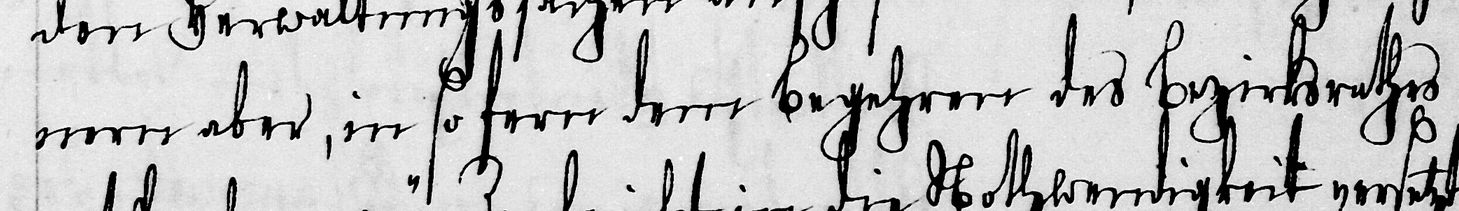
nnern aber, in so fern dem Begehren des Bezirksrathes
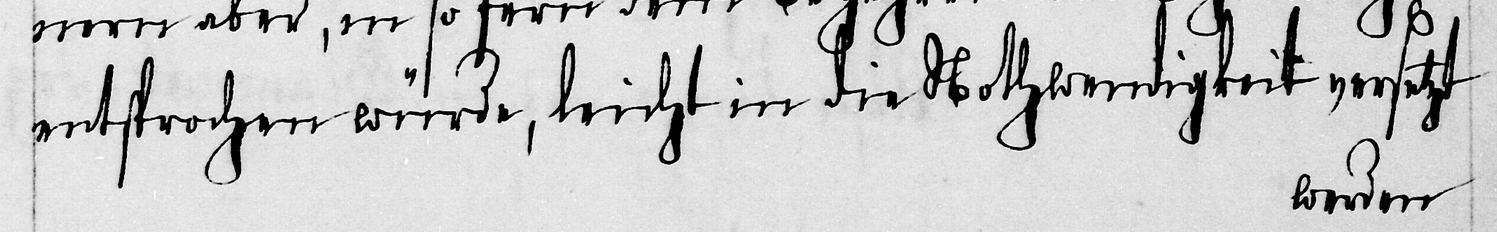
entsprochen würde, leicht in die Nothwendigkeit versetzt
